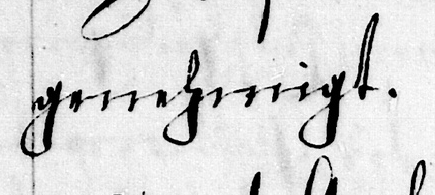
genehmigt.
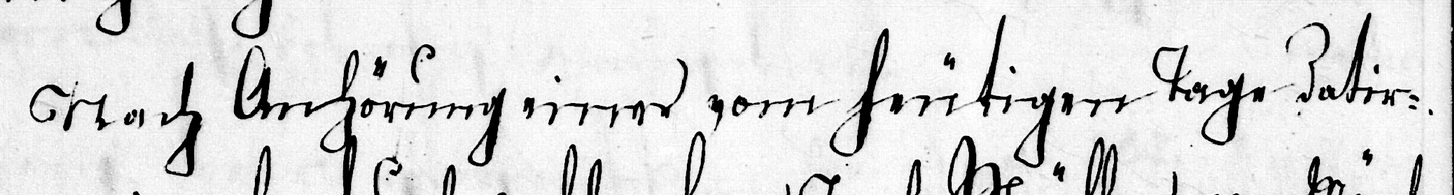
Nach Anhörung einer vom heutigen Tage datir¬
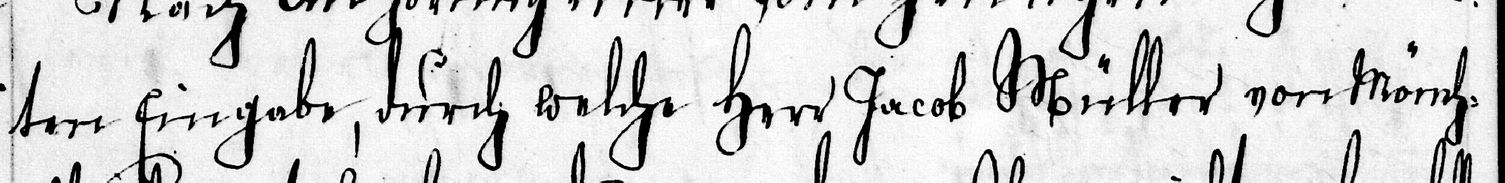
ten Eingabe, durch welche Herr Jacob Müller von Mönch¬
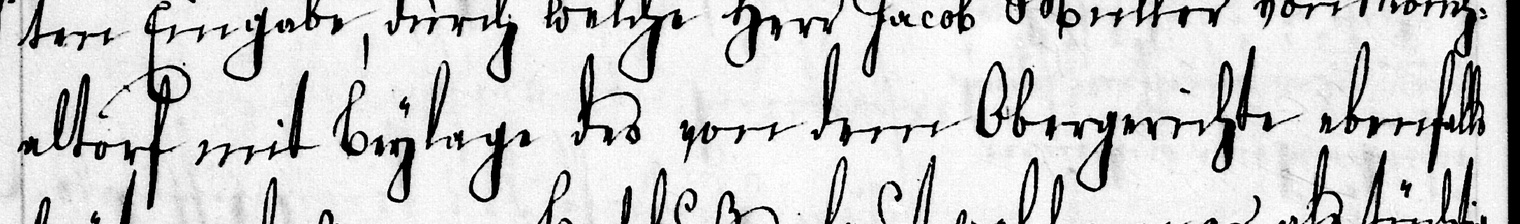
altorf mit Beylage des von dem Obergerichte ebenfal¬
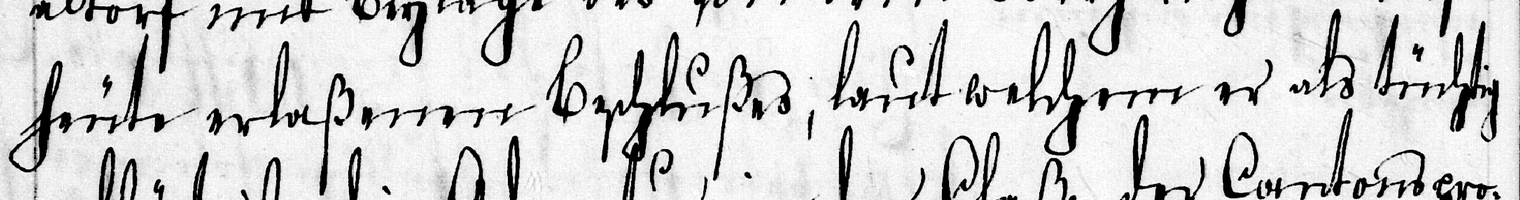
heute erlaßenen Beschlußes, laut welchem er als tüchtig
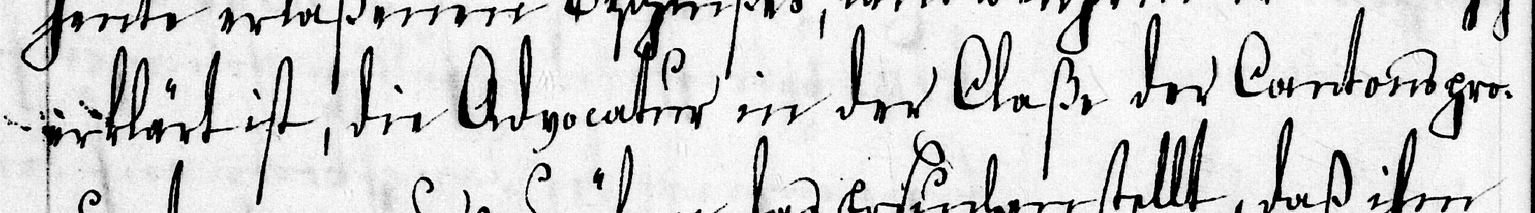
erklärt ist, die Advocatur in der Claße der Cantonspro¬
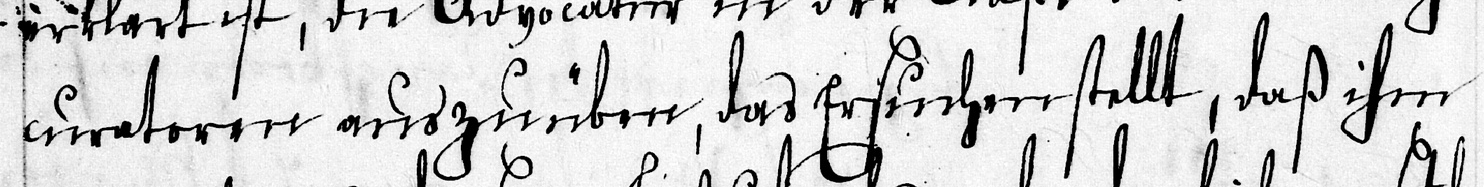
curatoren auszuüben, das Ersuchen stellt, daß ihm
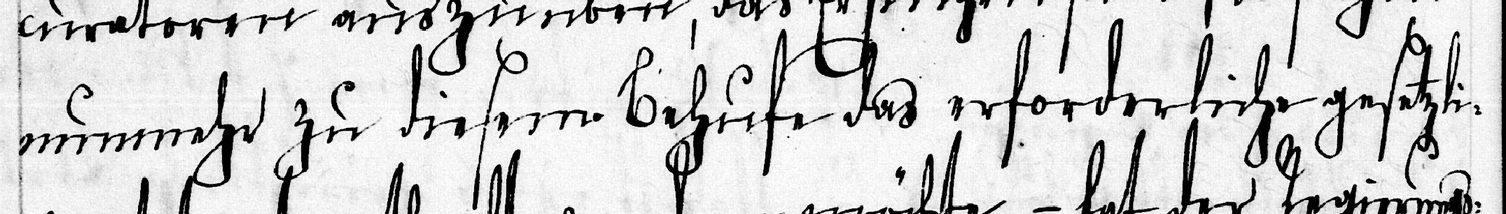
nunmehr zu diesem Behufe das erforderliche gesetz¬
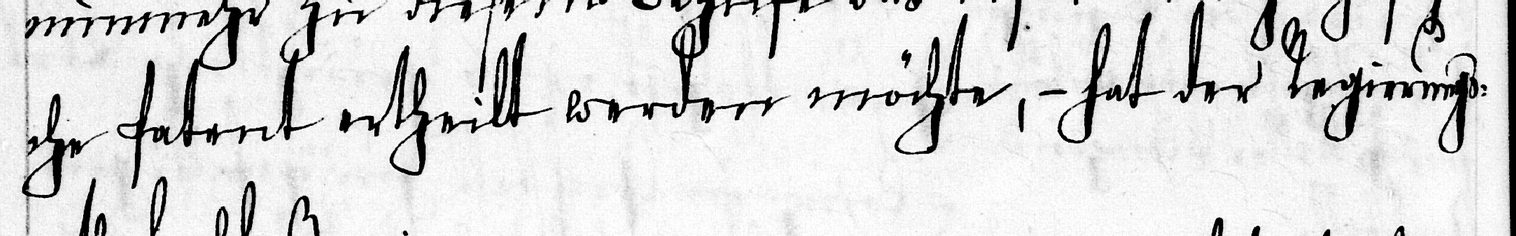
che Patent ertheilt werden möchte, – hat der Regierungs¬
